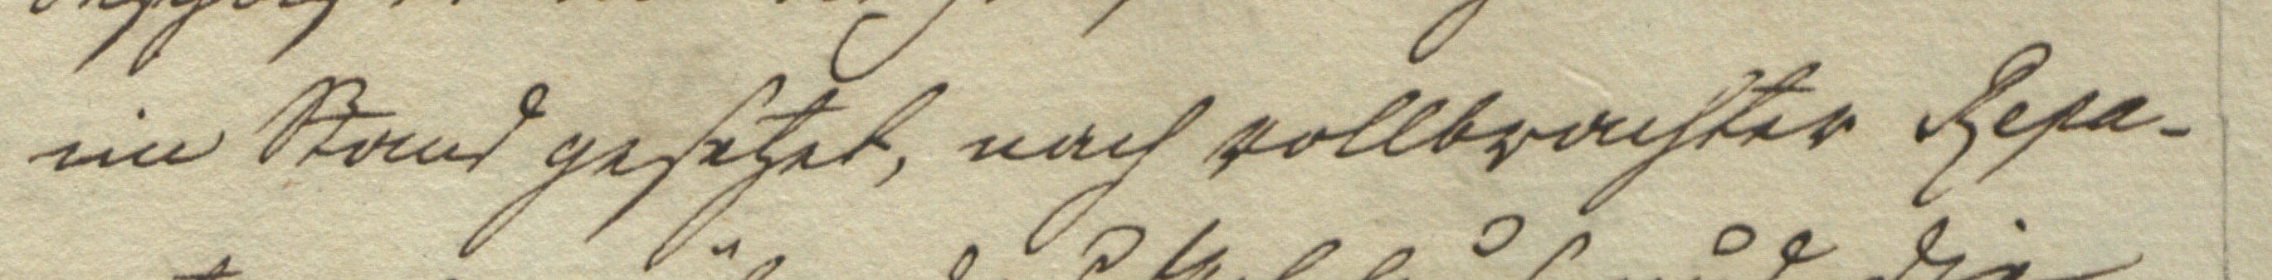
im Stand gesetzet, nach vollbrachter Repa¬
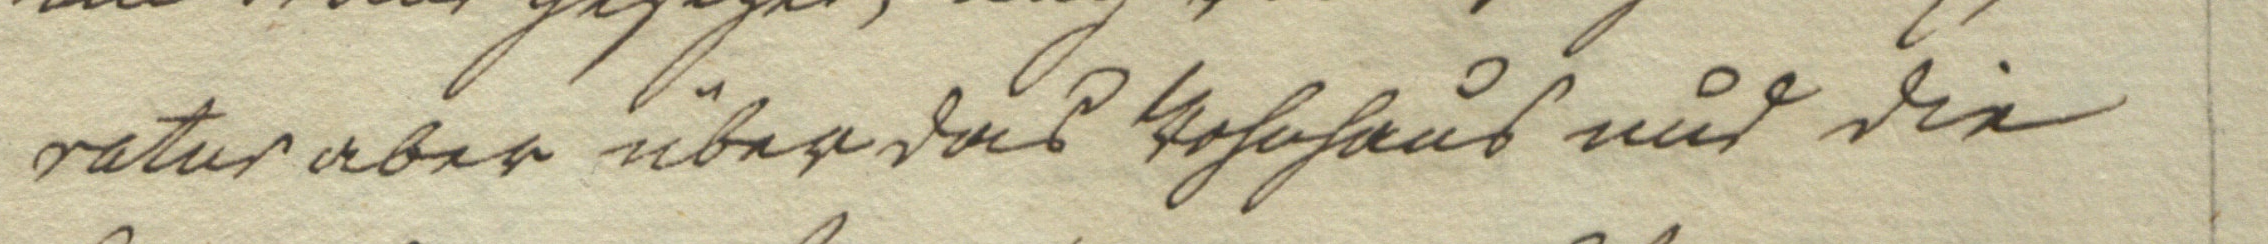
ratur aber über das Wohnhaus und die
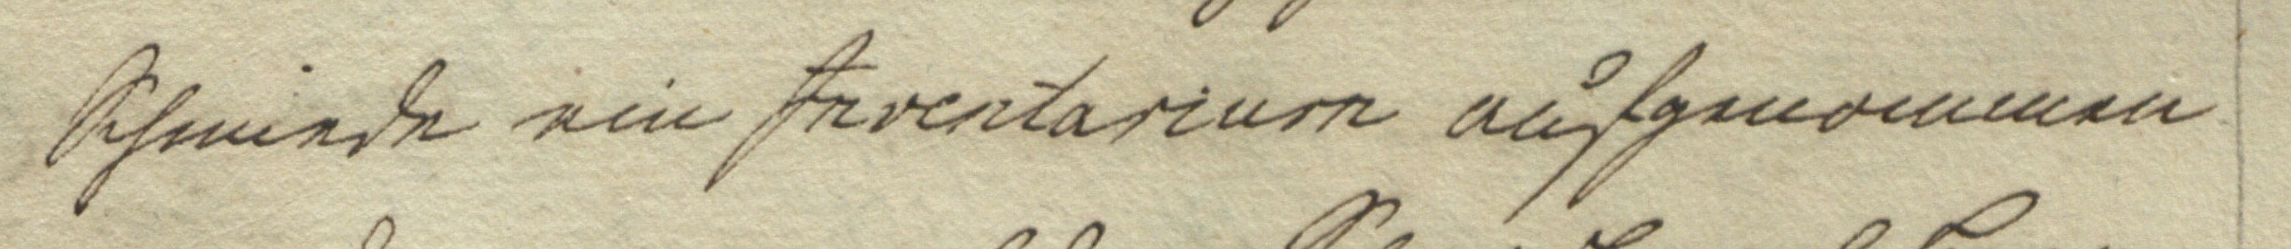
Schmiede ein Inventarium aufgenommen
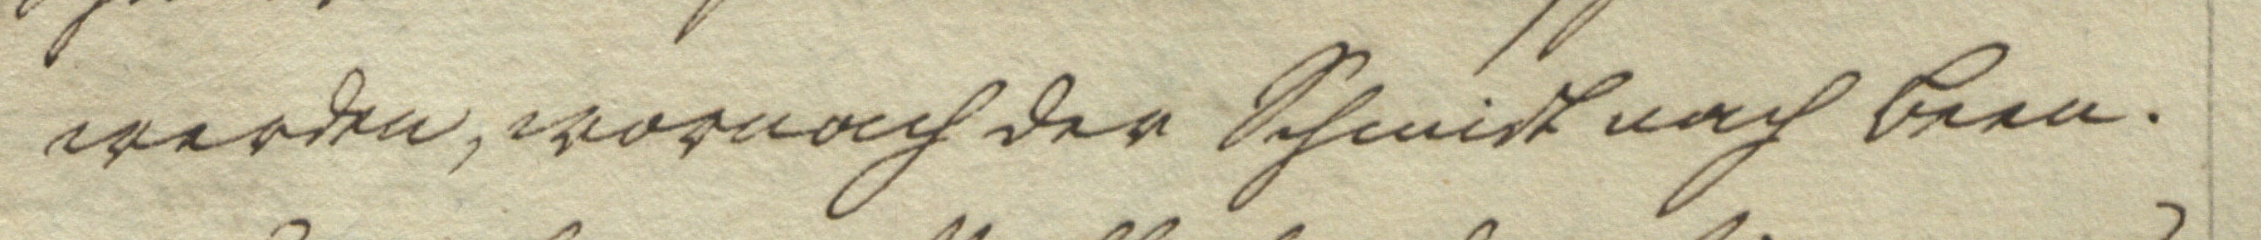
werden, wornach der Schmidt nach Been¬
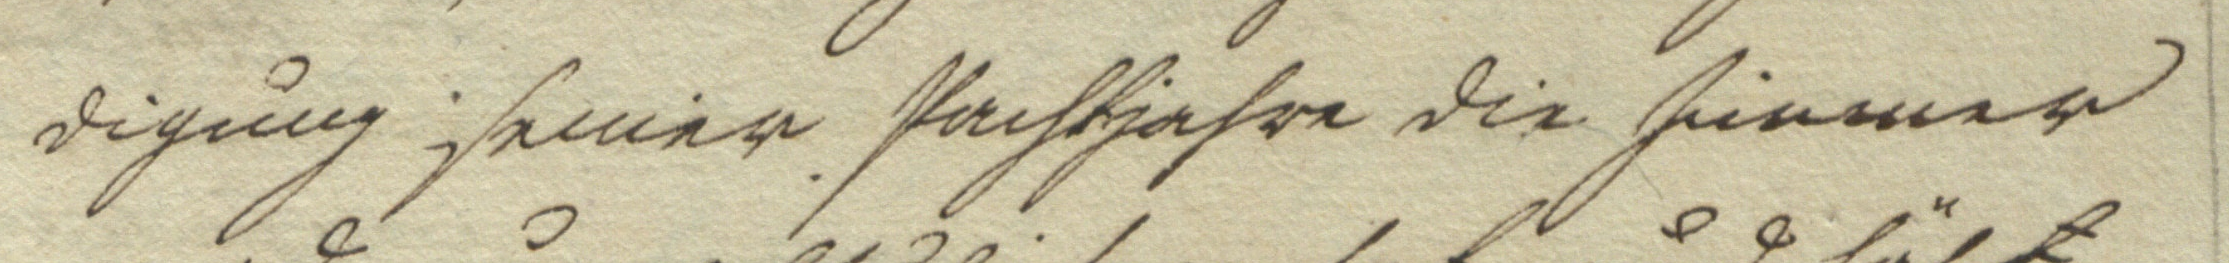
digung seiner Pachtjahre die Zimmer
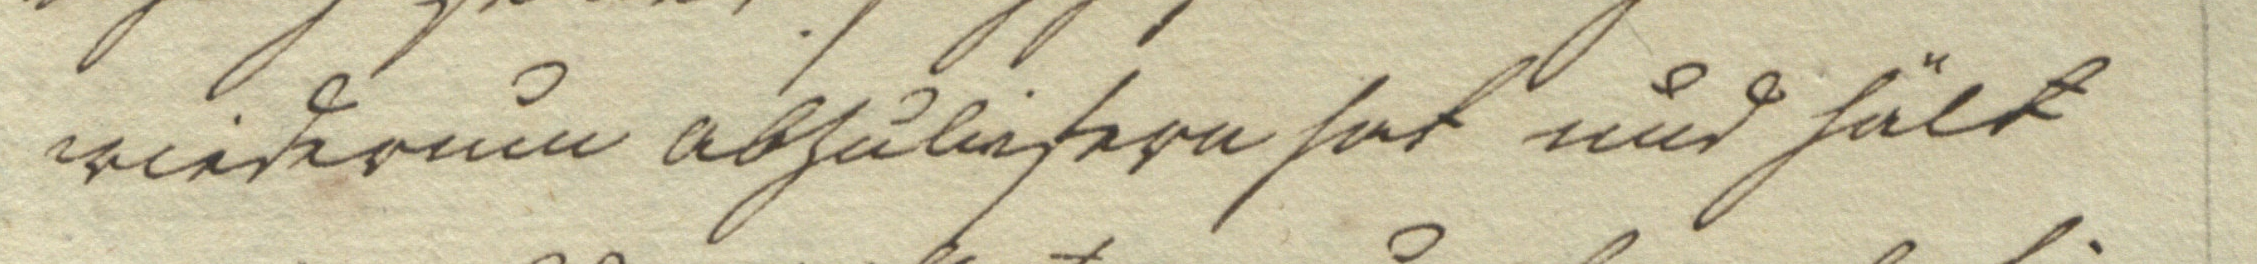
wiederum abzuliefern hat und hält
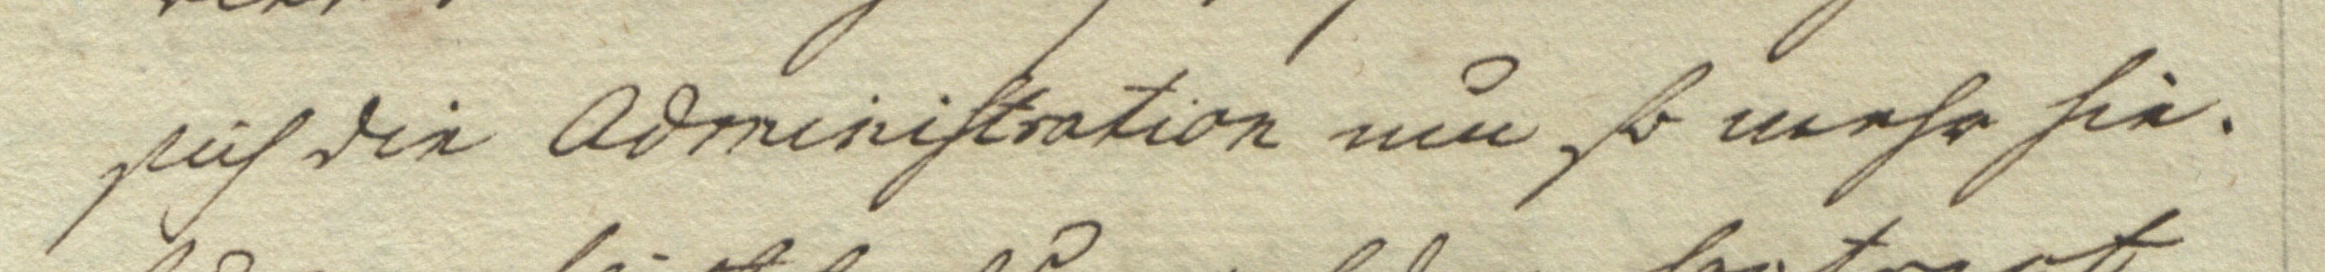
sich die Administration um so mehr hie¬
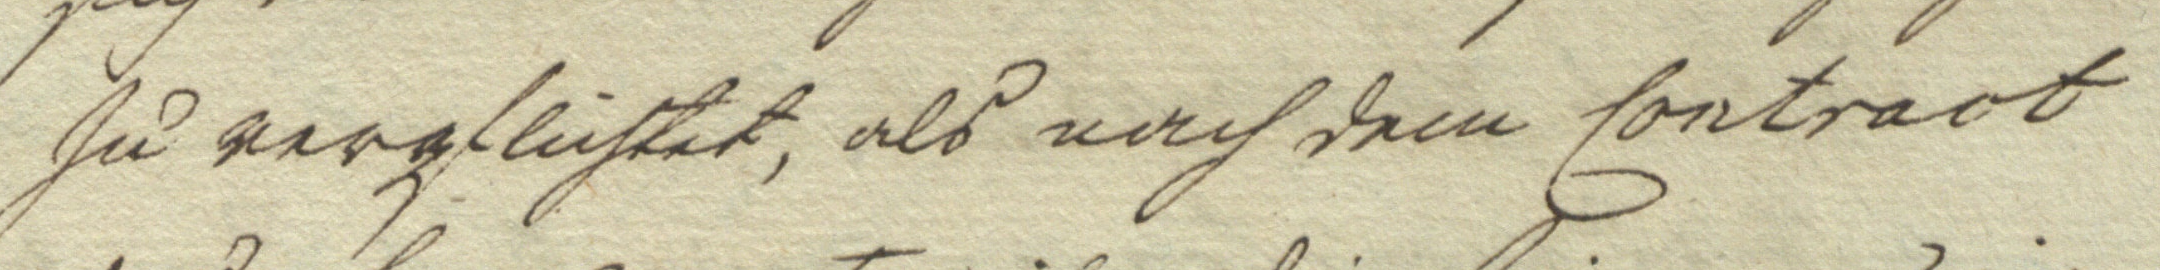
zu verpflichtet, als nach dem Contract
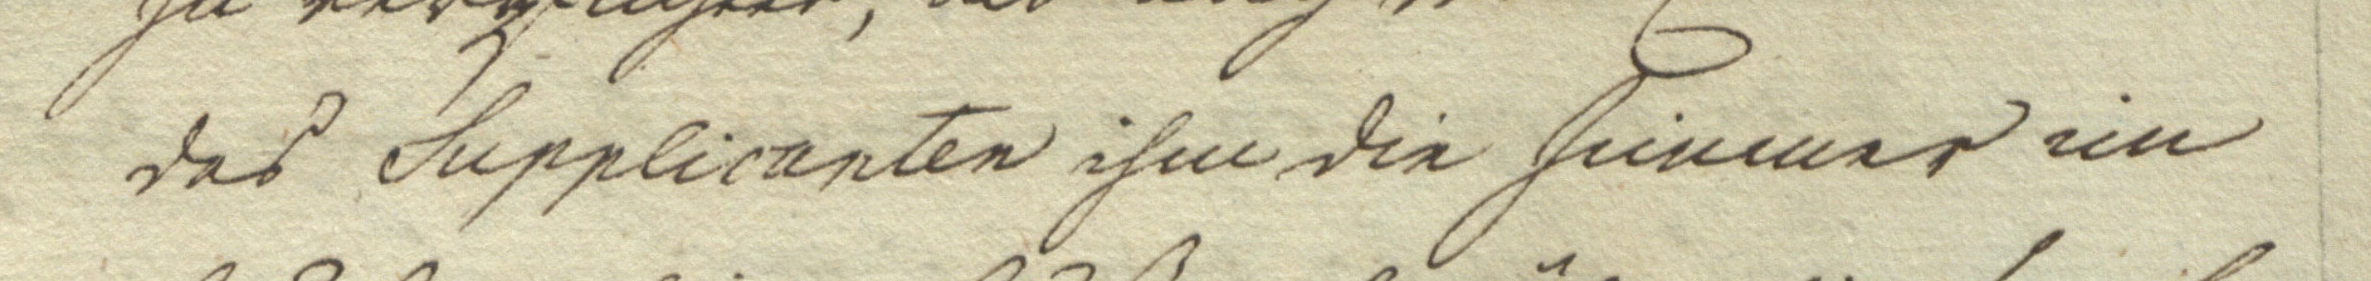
des Supplicanten ihm die Zimmer im
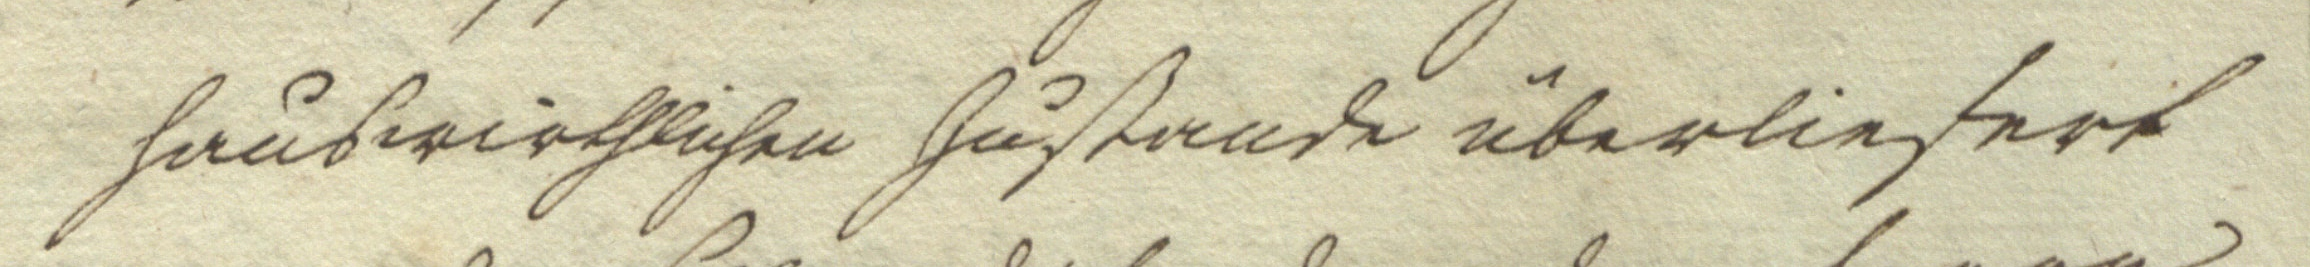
hauswirthlichen Zustande überliefert
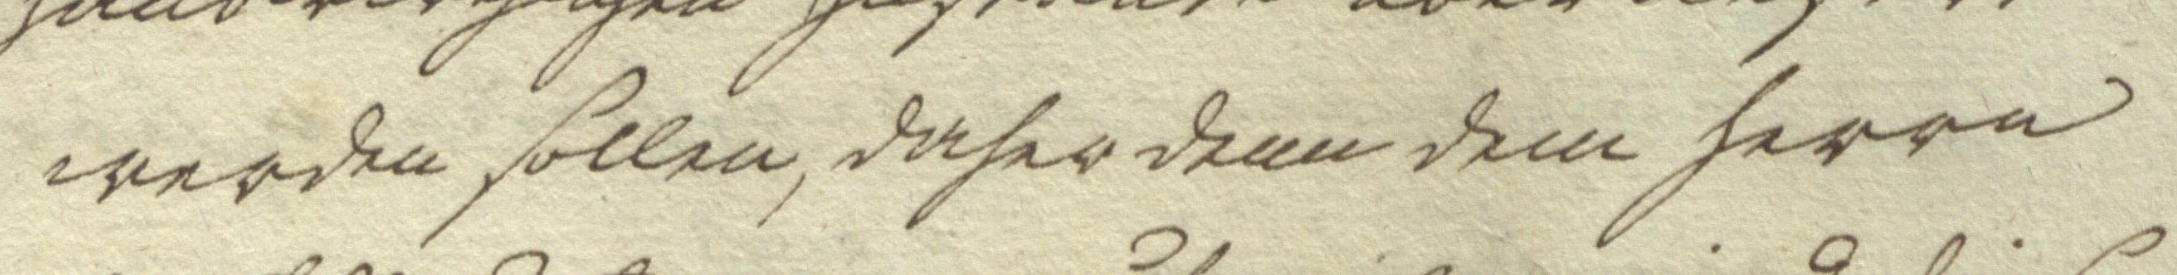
werden sollen, daher denn dem Herrn
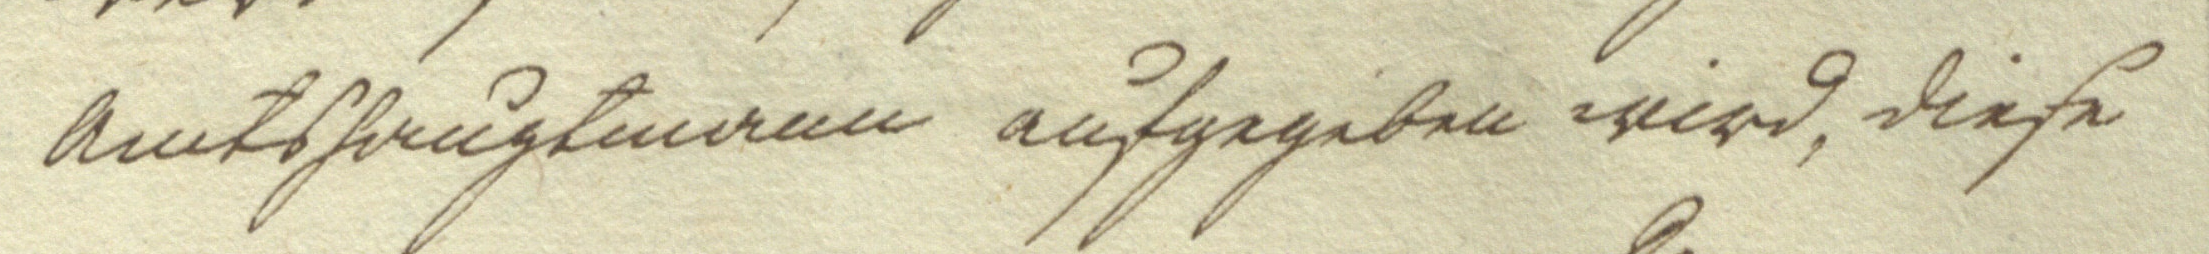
Amtshauptmann aufgegeben wird, diese
